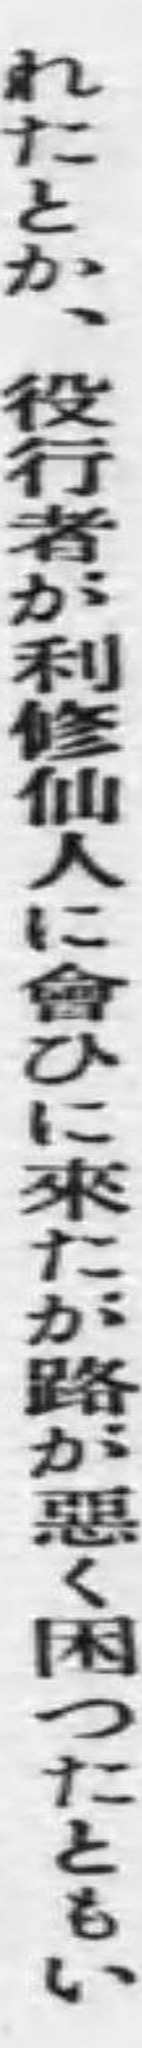れたとか、役行者が利修仙人に會ひに來たが路が惡く困つたともい
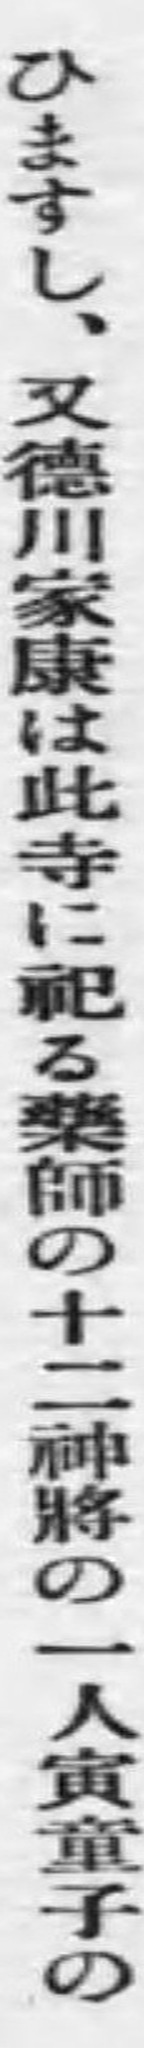ひますし、又徳川家康は此寺に祀る藥師の十二神將の一人寅童子の
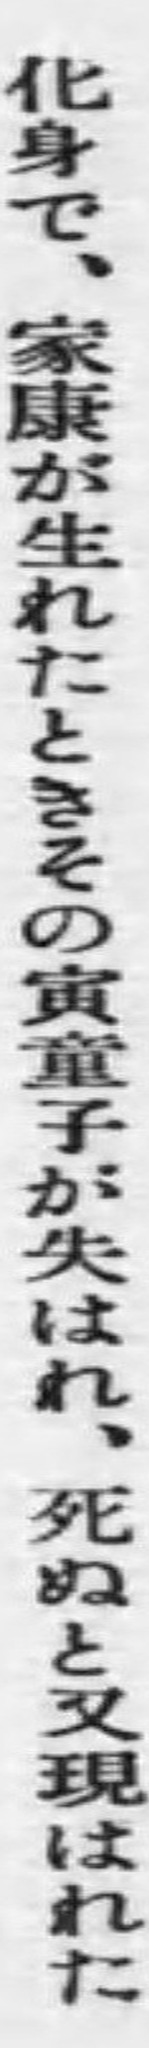化身で、家康が生れたときその寅童子が失はれ、死ぬと又現はれた
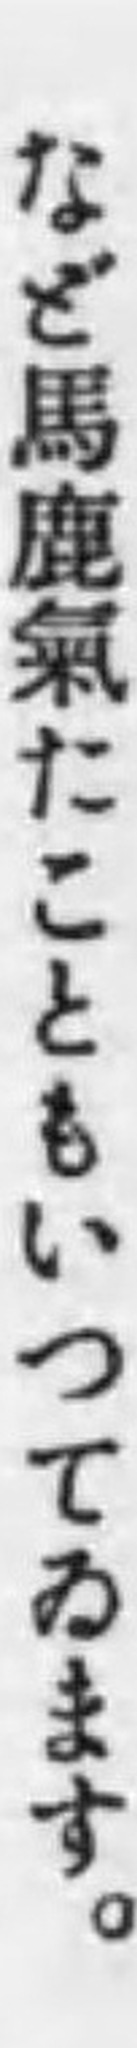など馬鹿氣たこともいつてゐます。
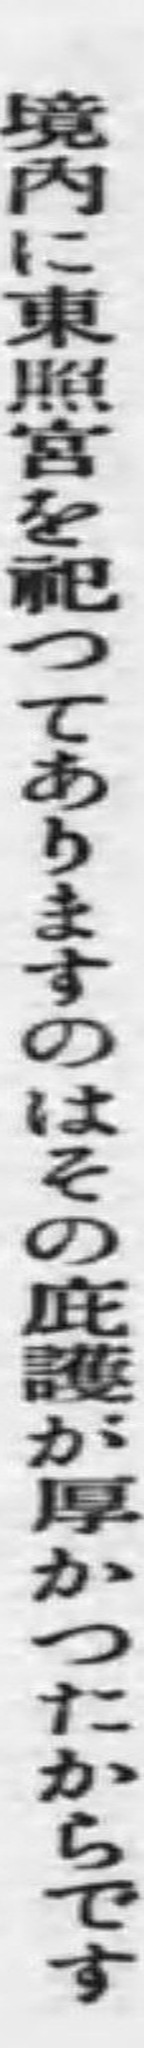境内に東照宮を祀つてありますのはその庇護が厚かつたからです
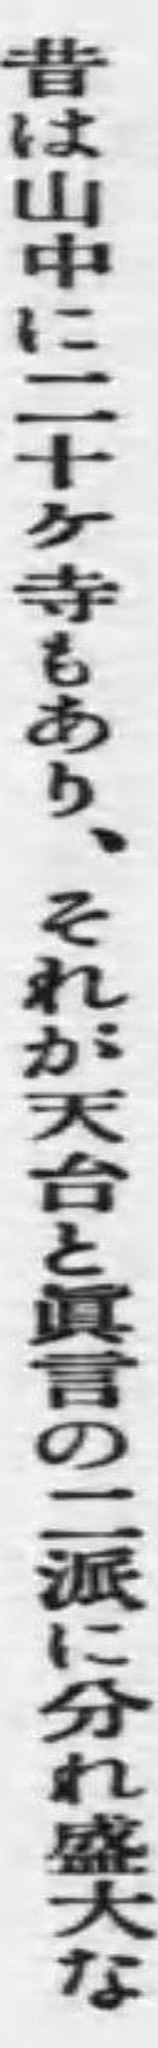昔は山中に二十ヶ寺もあり、それが天台と眞言の二派に分れ盛大な

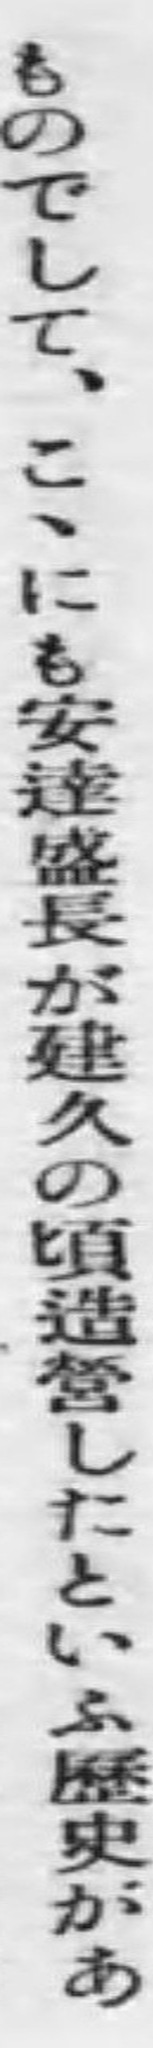ものでして、こヽにも安達盛長が建久の頃造營したといふ歴史があ
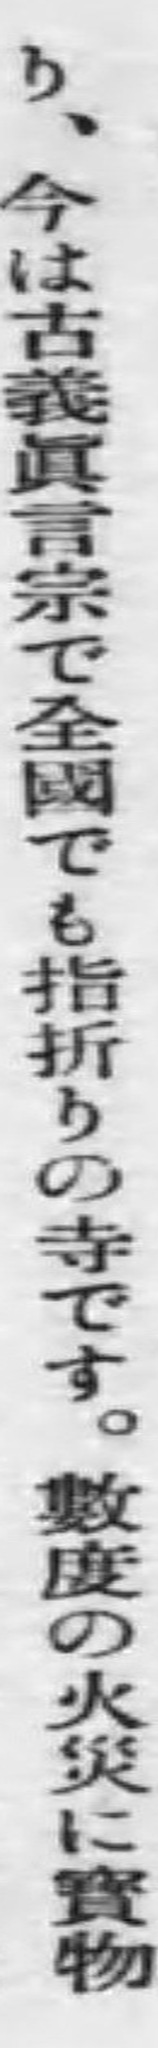り、今は古義眞言宗で全國でも指折りの寺です。數度の火災に寶物
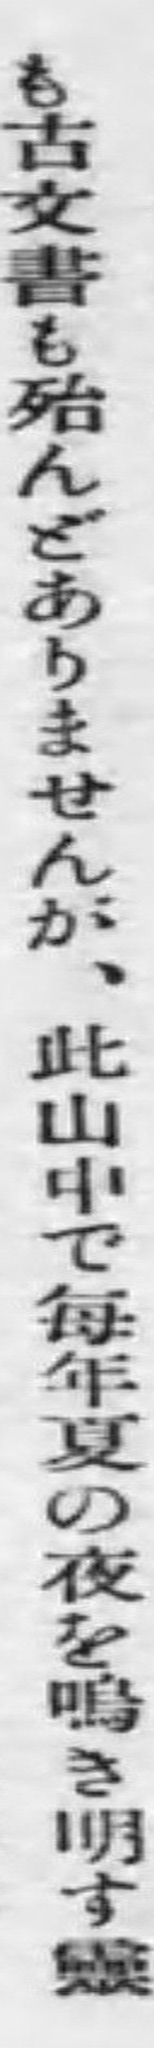も古文書も殆んどありませんが、此山中で每年夏の夜を鳴き明す靈
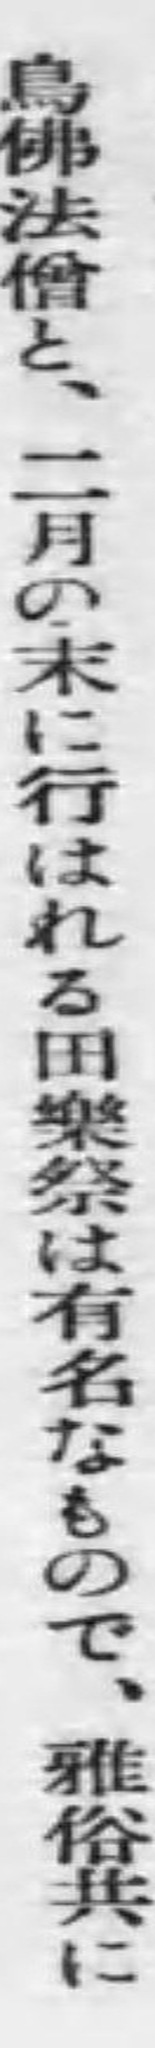鳥佛法僧と、二月の末に行はれる田樂祭は有名なもので、雅俗共に
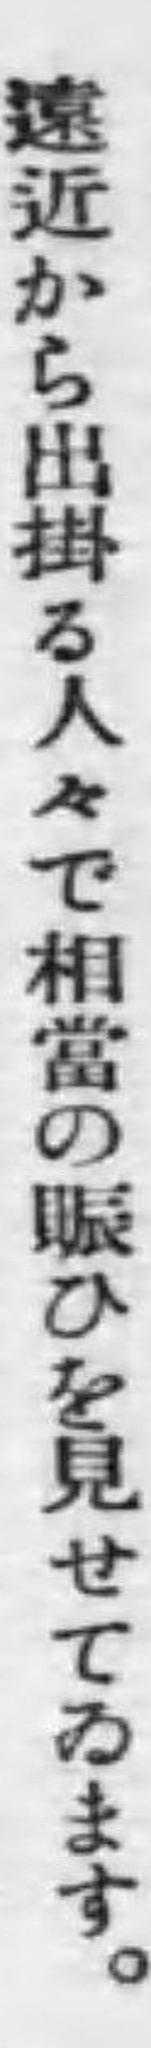遠近から出掛る人々で相當の賑ひを見せてゐます。
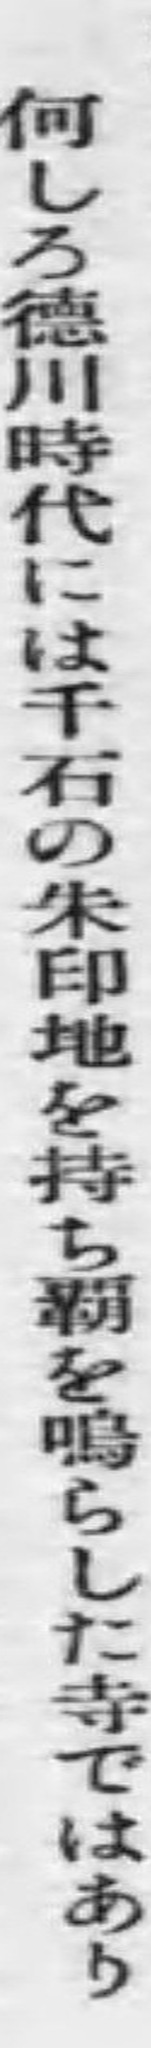何しろ徳川時代には千石の朱印地を持ち覇を鳴らした寺ではあり
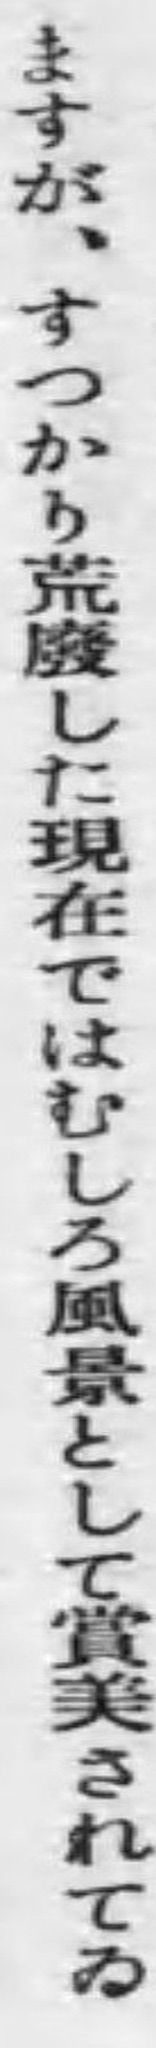ますが、すつかり荒廢した現在ではむしろ風景として賞美されてゐ
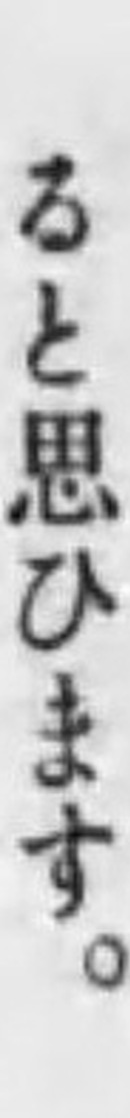ると思ひます。
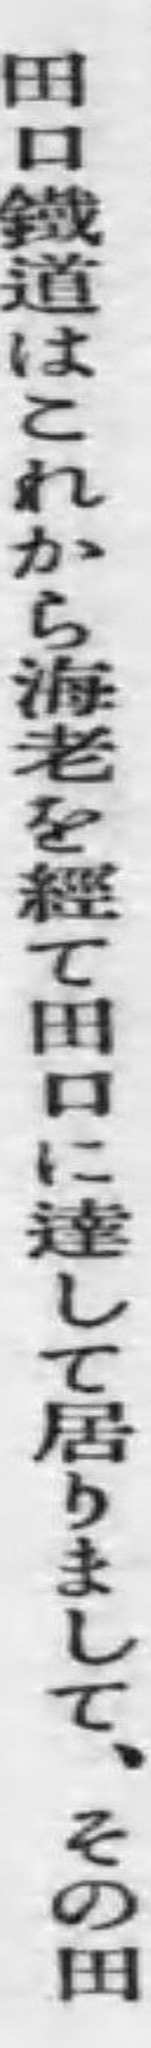田口鐵道はこれから海老を經て田口に達して居りまして、その田
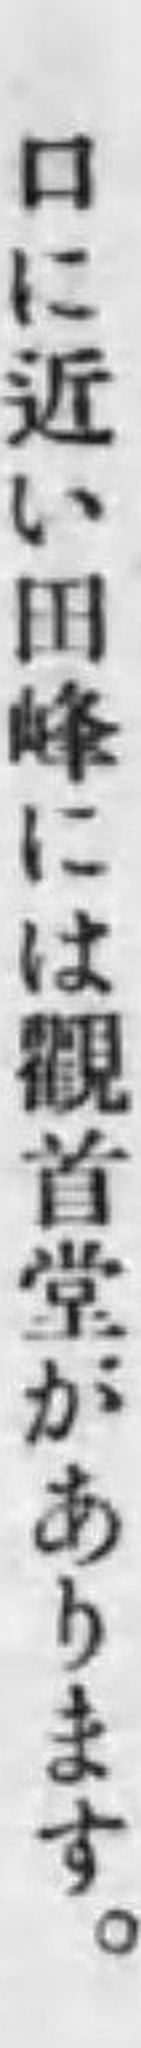口に近い田峰には觀首堂があります。
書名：東三河道中記 : 豊橋市及其附近案内
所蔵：国立国会図書館 National Diet Library, JAPAN
